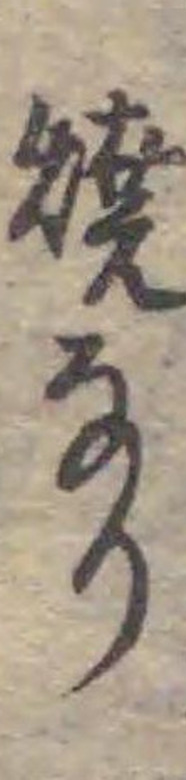焼なり
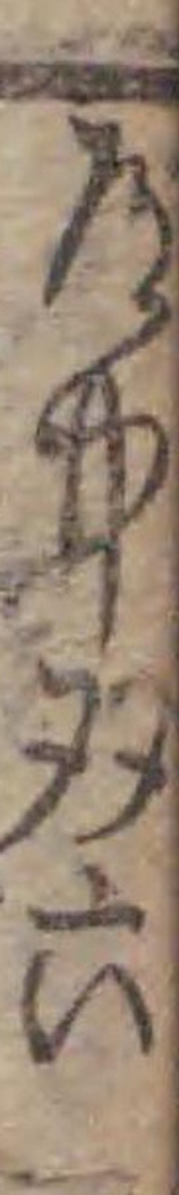道中双六
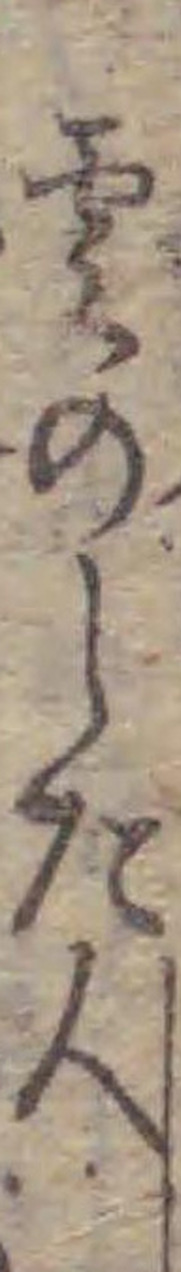雲のした人
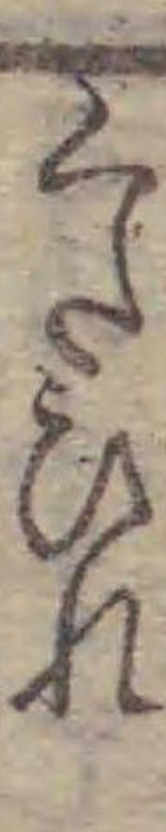くたびれ
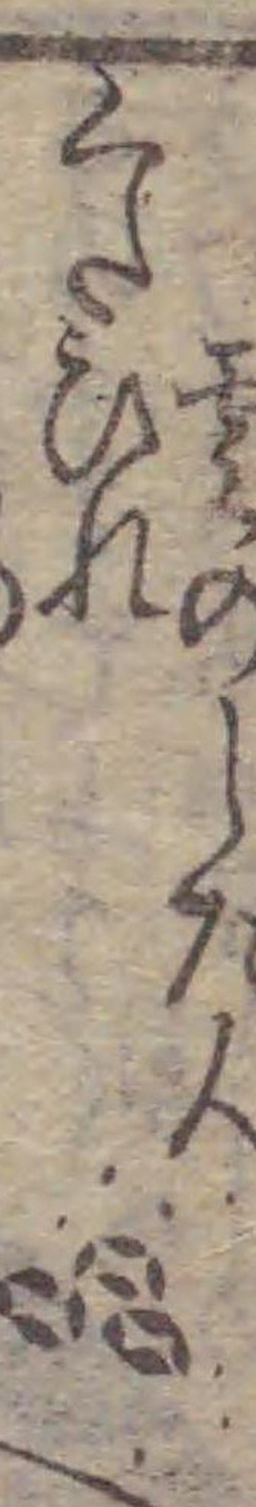くたびれ
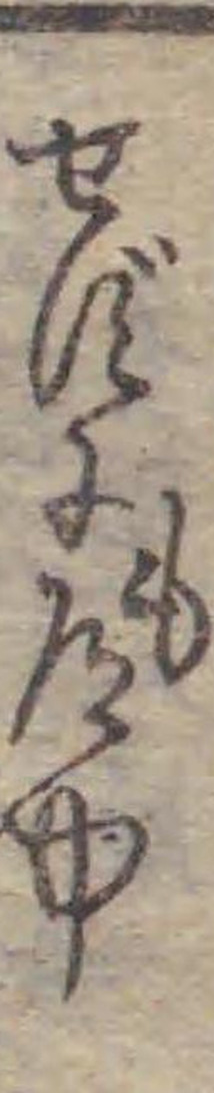せずに道中
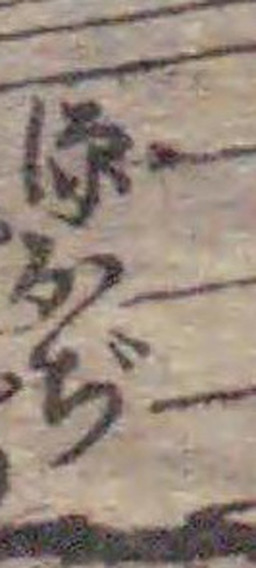源おぢ
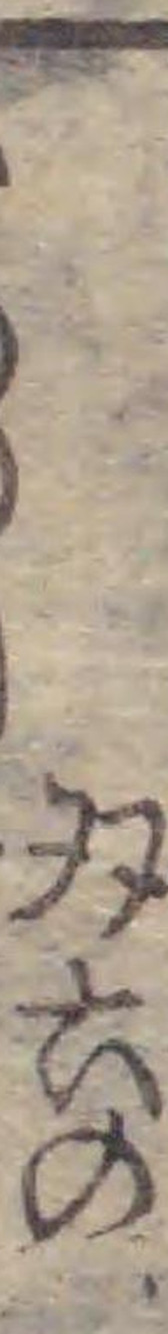双六の
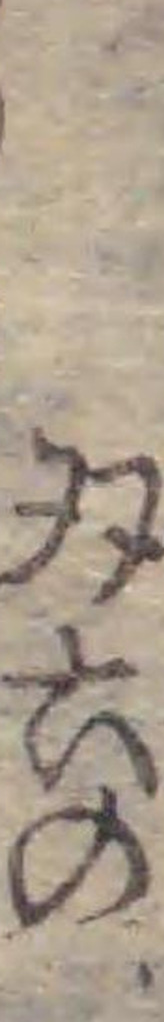双六の
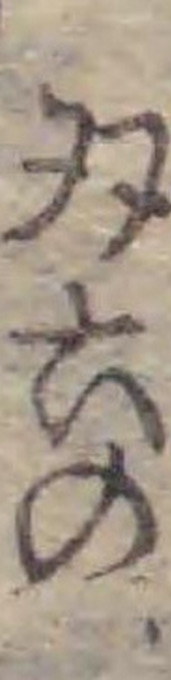双六の
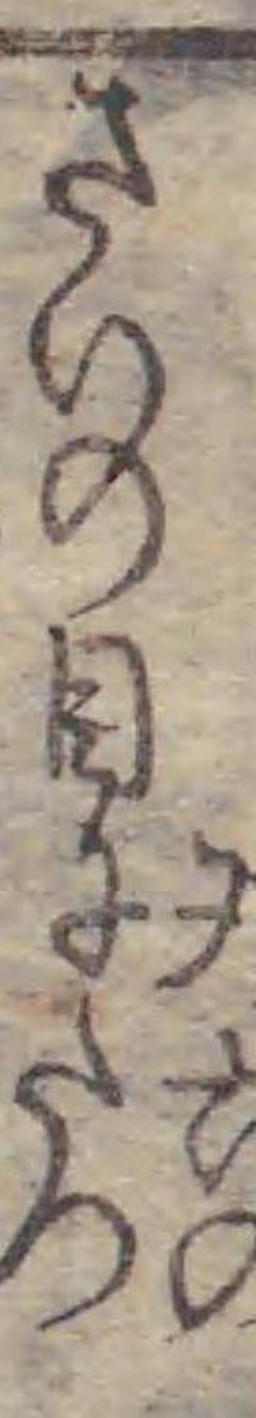さいの目にたつ
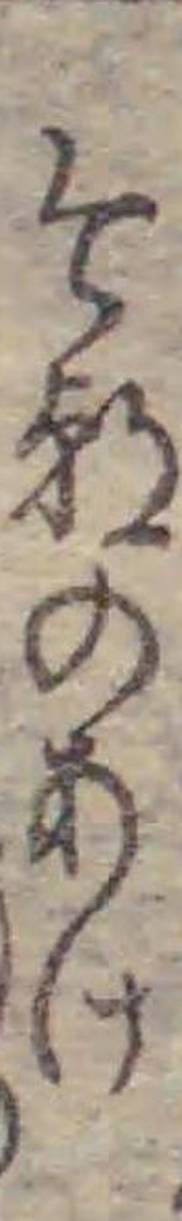今朝のあけ
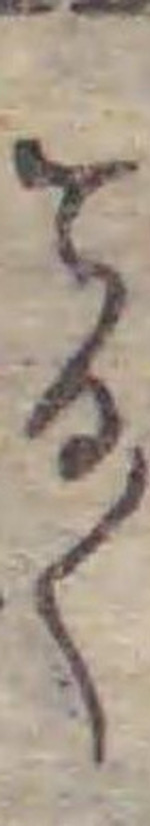てる〳〵
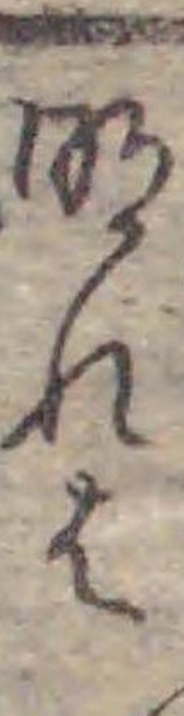明れは
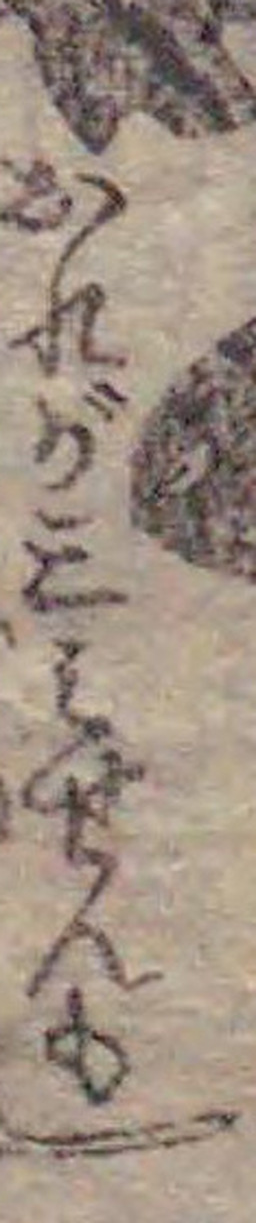おれが三みせんも
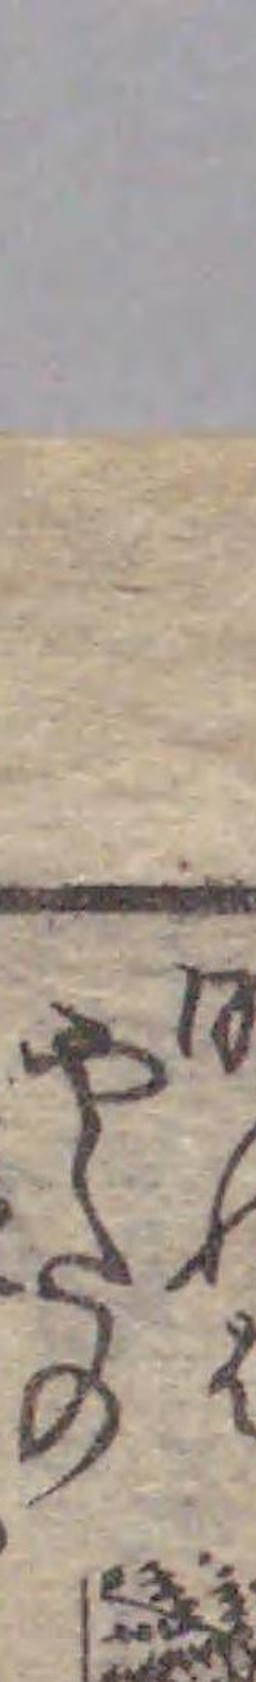やたの
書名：年始御礼帳 : 3巻
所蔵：国立国会図書館 National Diet Library, JAPAN
